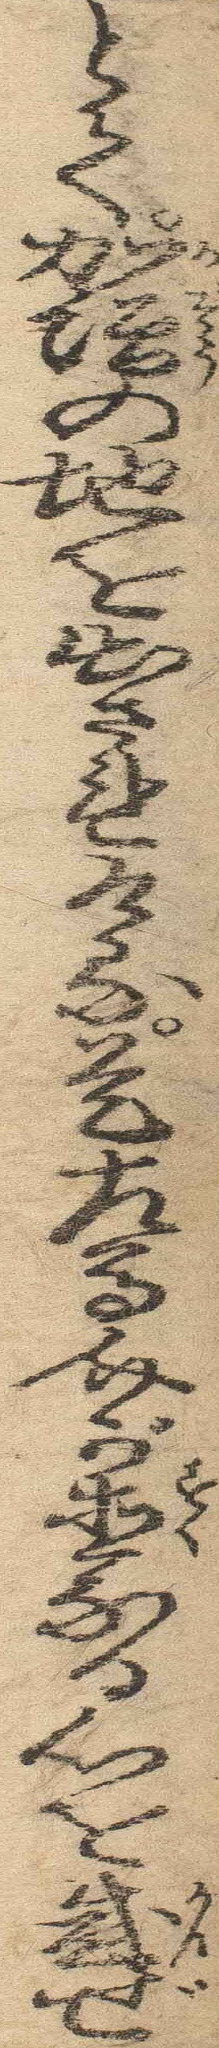とて加増の地を出されける。是左馬介が直なる心を感ぜ
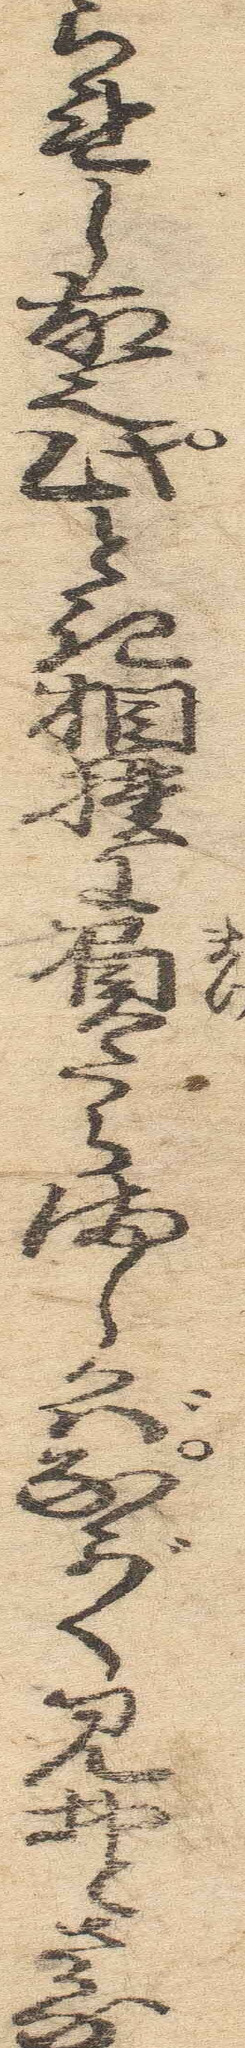られし故也。此とき相撲に負たりましかば。ながく見おとさる
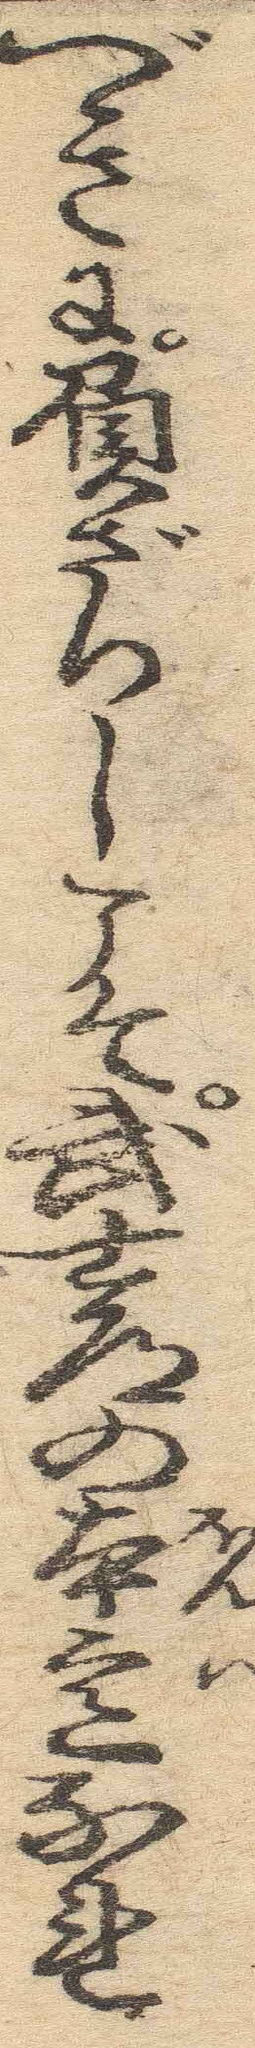べきに。負ざりしこそ。武士道の本意なれ
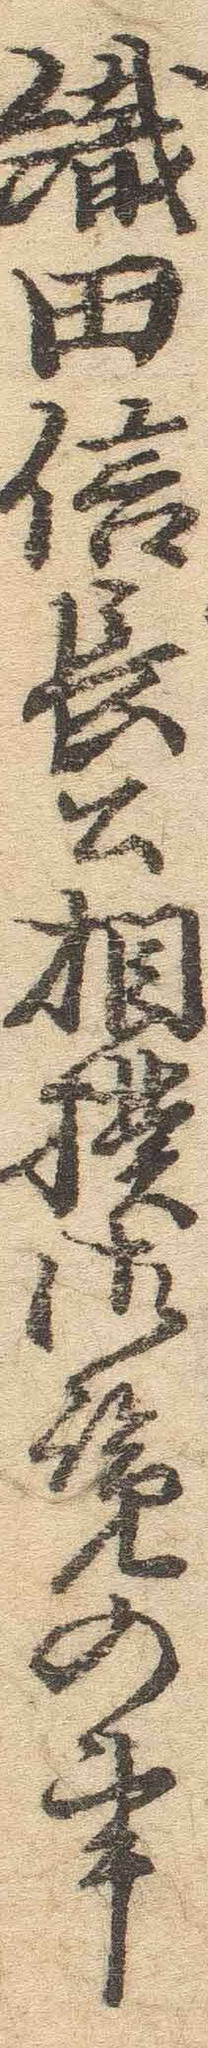織田信長公相撲御覧の事
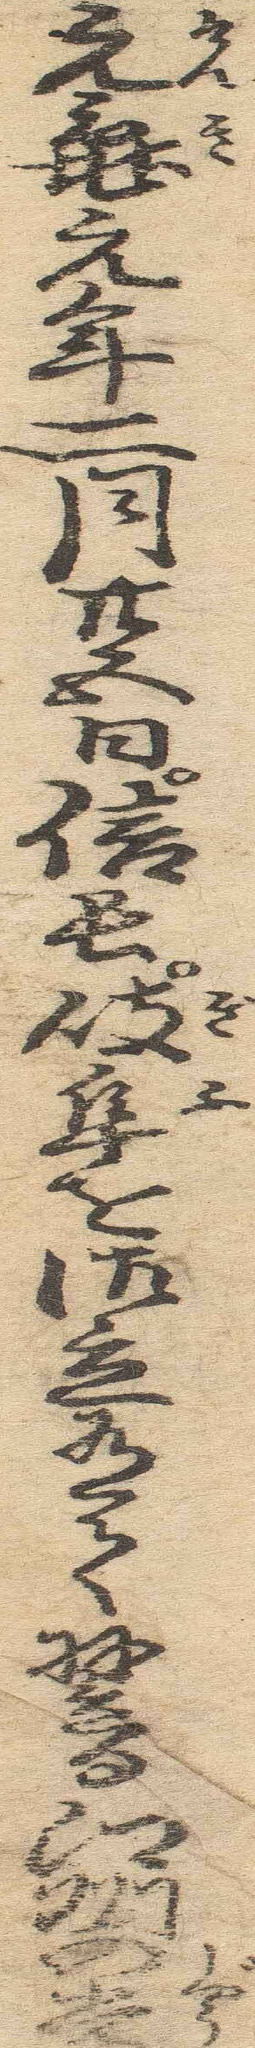元亀元年二月廿五日。信長。岐阜を御立有て翌日江州の常
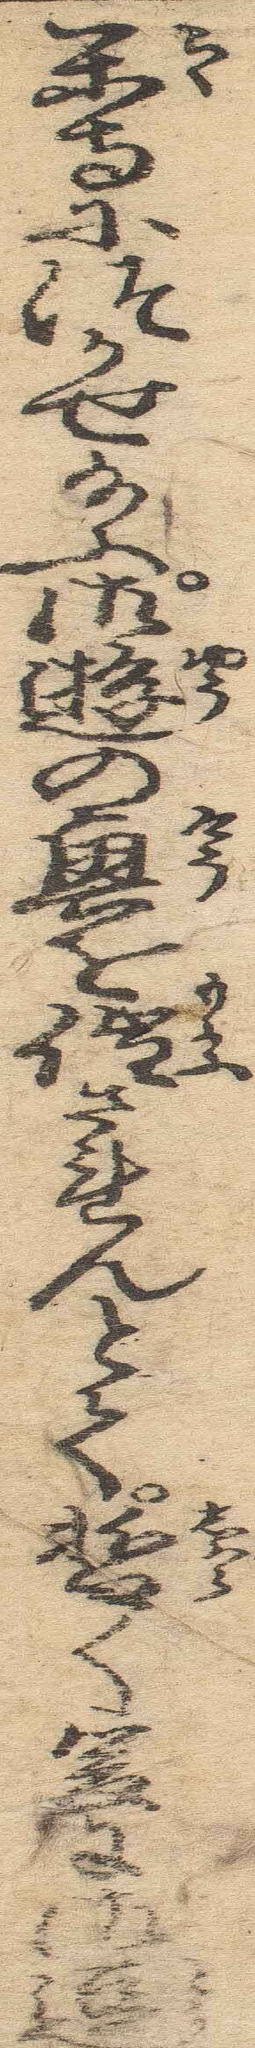楽寺につかせ給ふ。御遊の興を催されんとて。暫く爰に逗
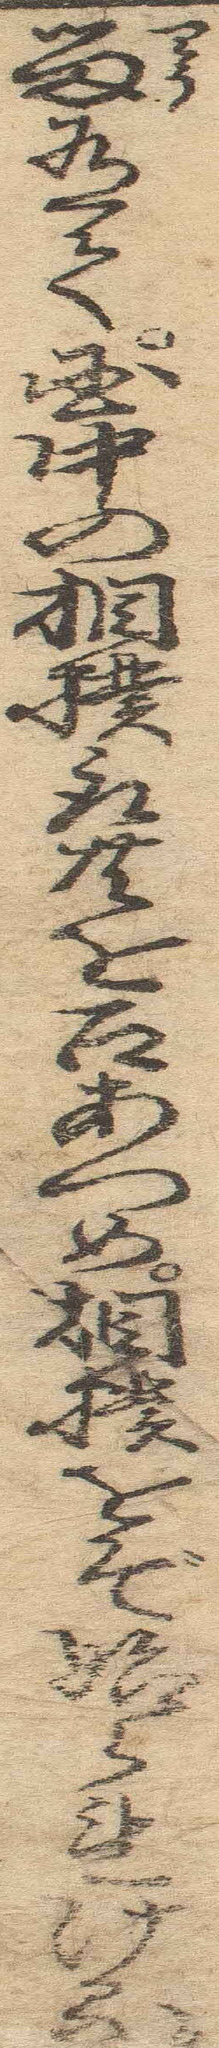留有て。国中の相撲取共を召あつめ。相撲をぞ始られける。
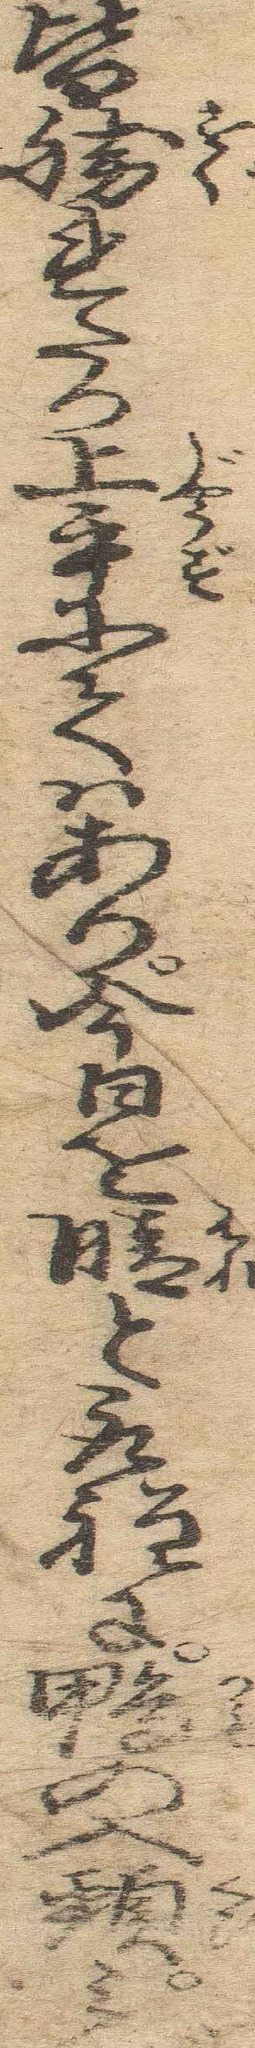皆勝れたる上手にてはあり。今日を晴と取程に。鴨の入頸。みづ
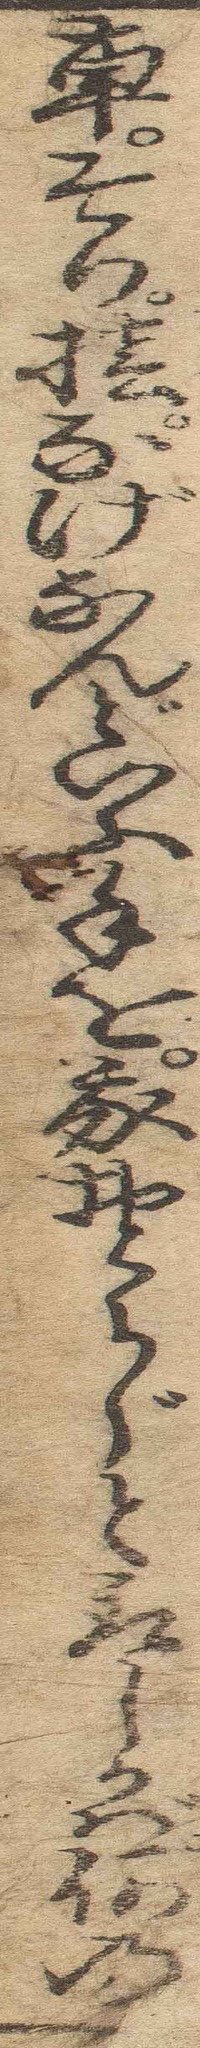車。そり。捻。なげなんどいふ手を。我おとらじと取しかば。何の

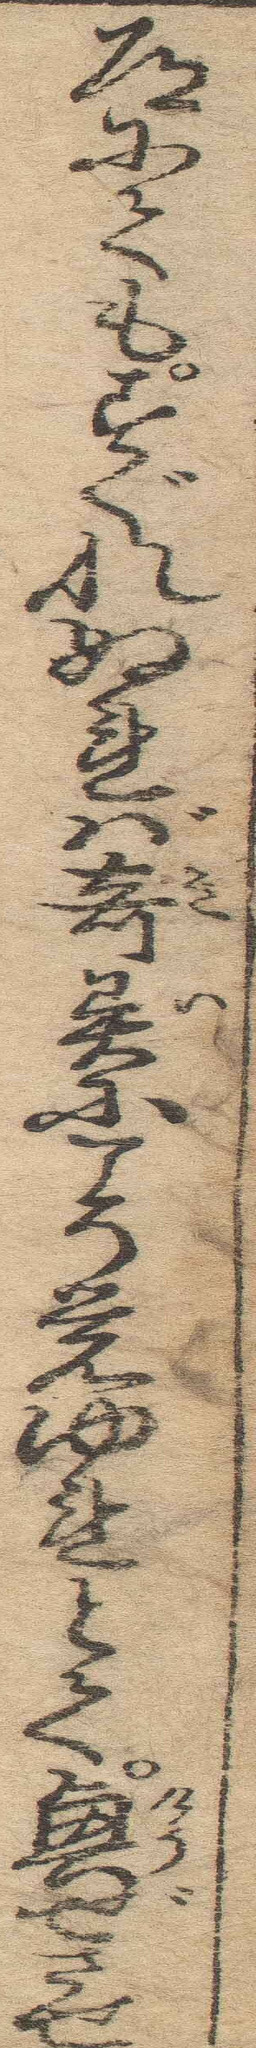道にても。すぐれぬれば。奇異にこそ覚ゆれとて。興ぜさせ
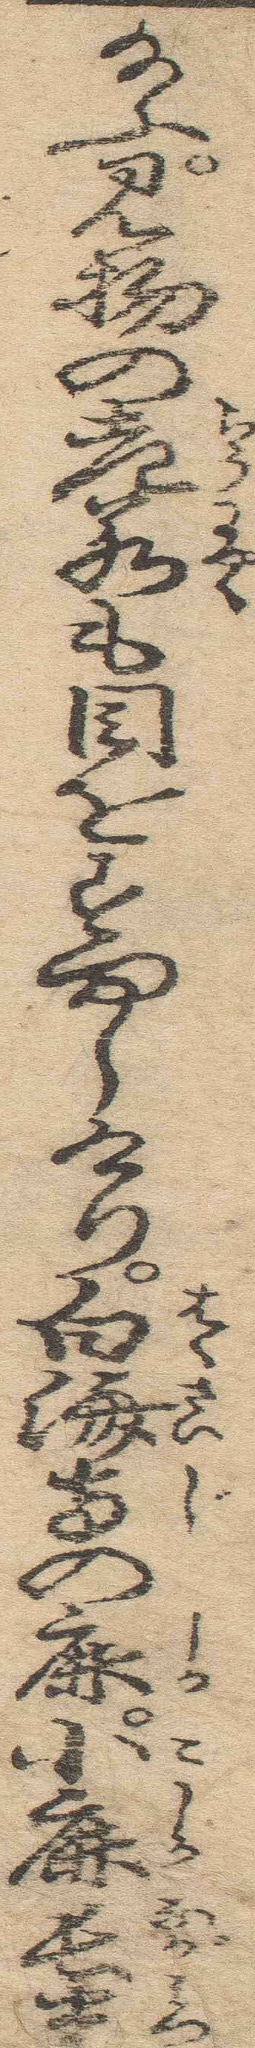給ふ。見物の老若も目をすましけり。白寺の廉。小廉。長光。
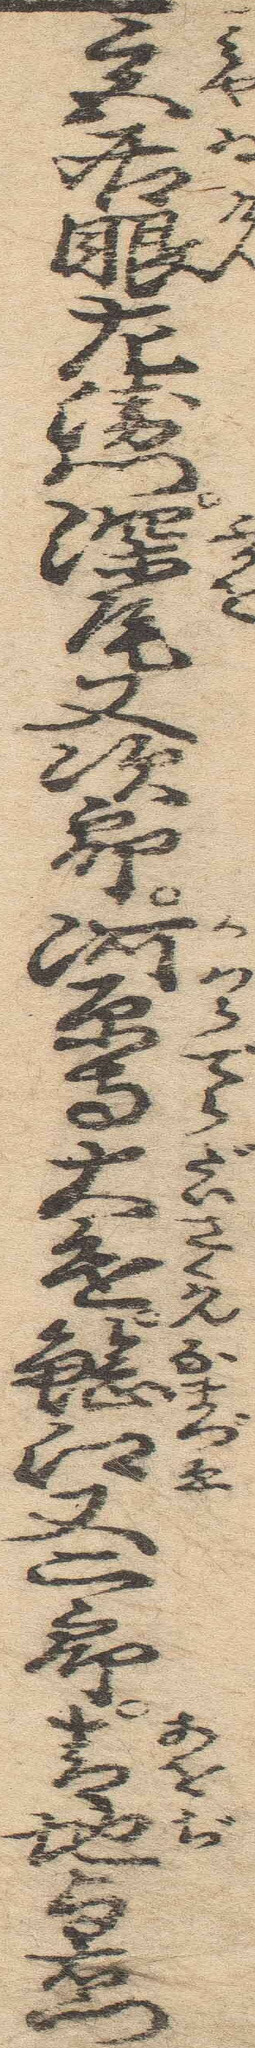宮居目眼左衛門。深尾又次郎。河原寺大進。鯰江又二郎。青地与右衛門
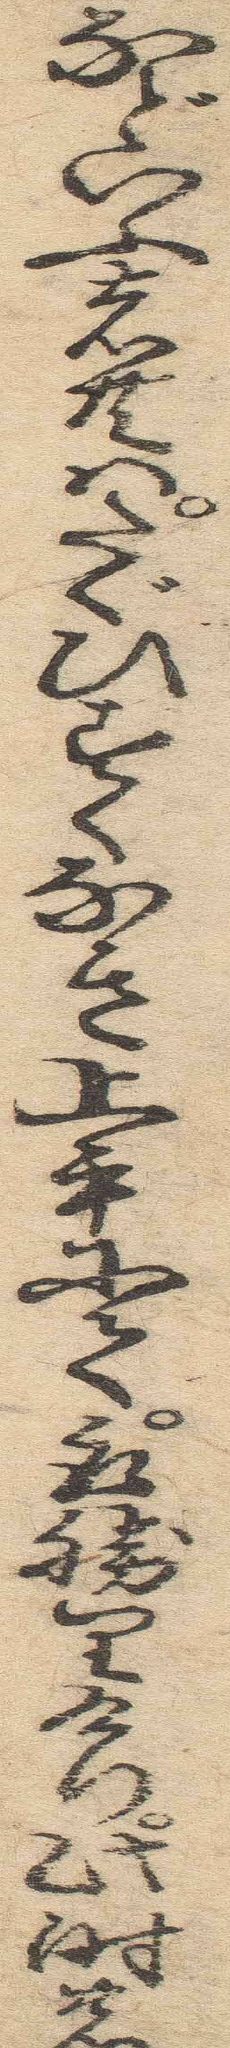などいふ者共は。たぐひすくなき上手にて。取勝りかり。此時は
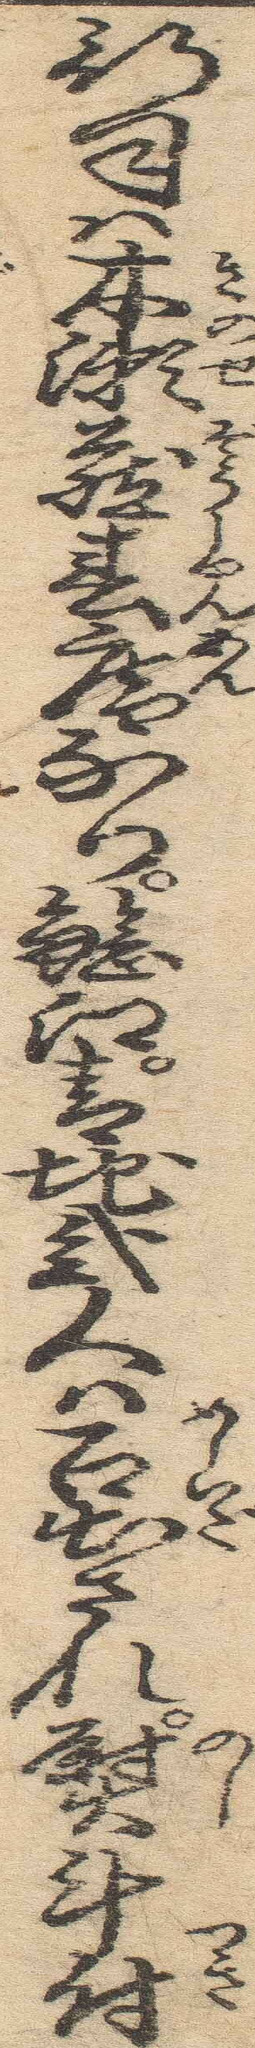行司は木瀬蔵春庵なり。鯰江。青地弐人は召出され。熨斗付
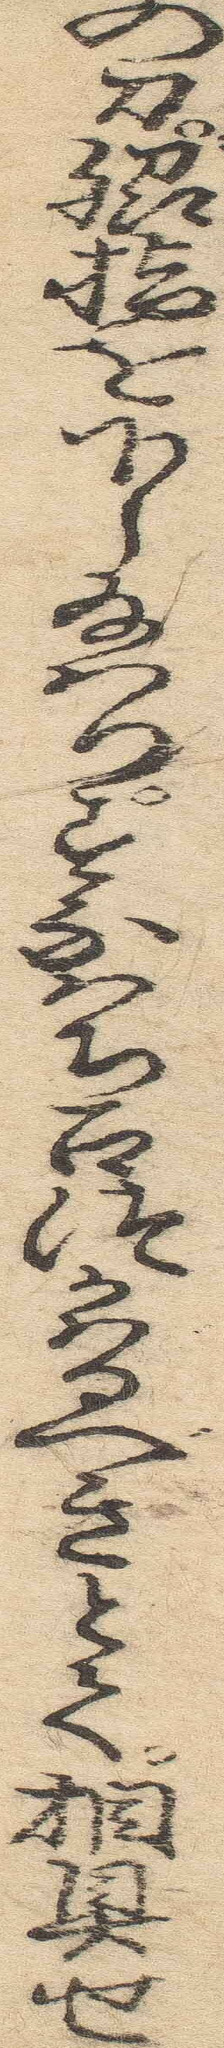の刀。脇差を下し給はり。すなはち召つかはるへきとて相具せ
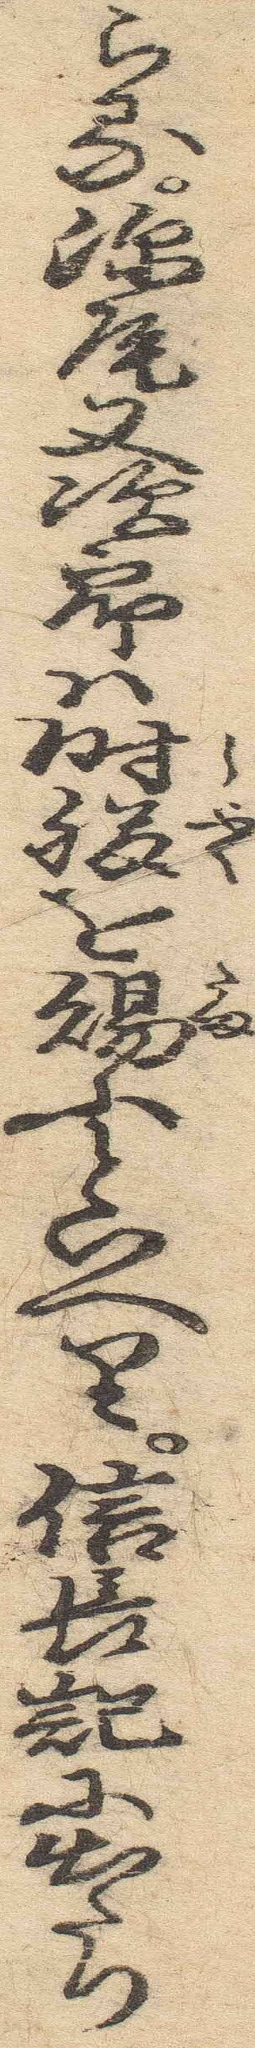らる。深尾又次郎は時服を賜ふといへり。信長記に出たり
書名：古今相撲大全
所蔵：東京学芸大学附属図書館 国文学研究資料館
